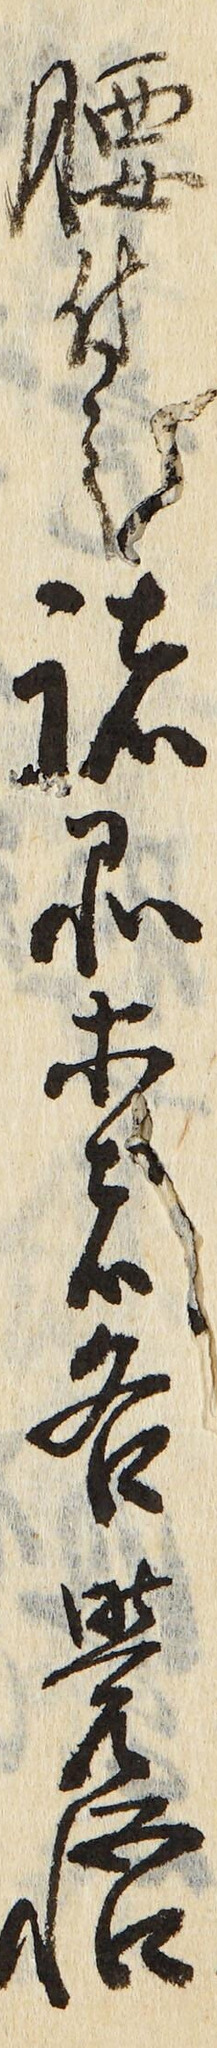腰付之諸品等者各覚悟
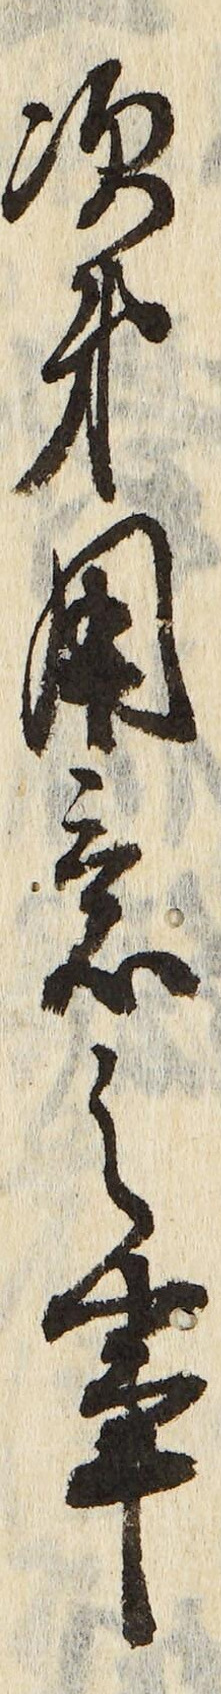次第用意之事
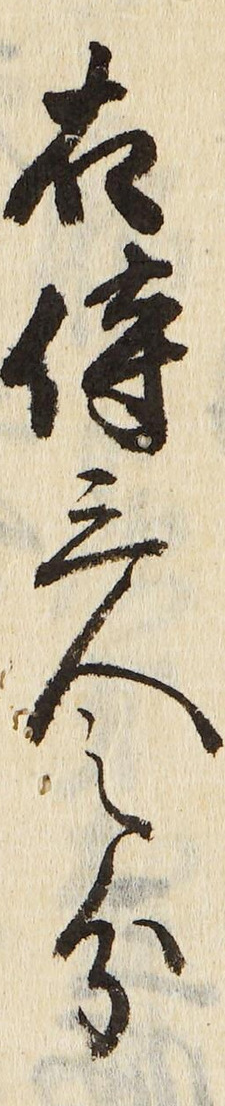右侍三人之分
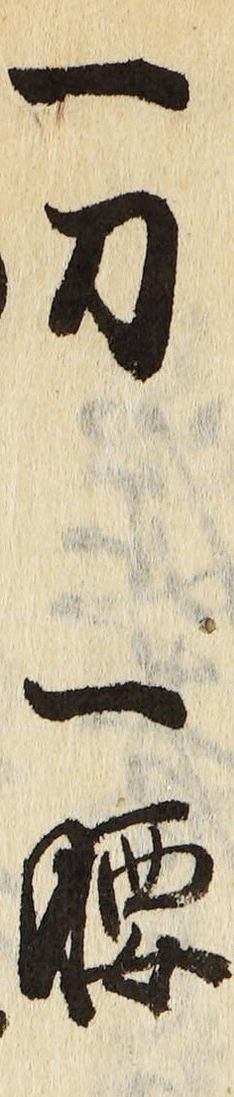一刀一腰
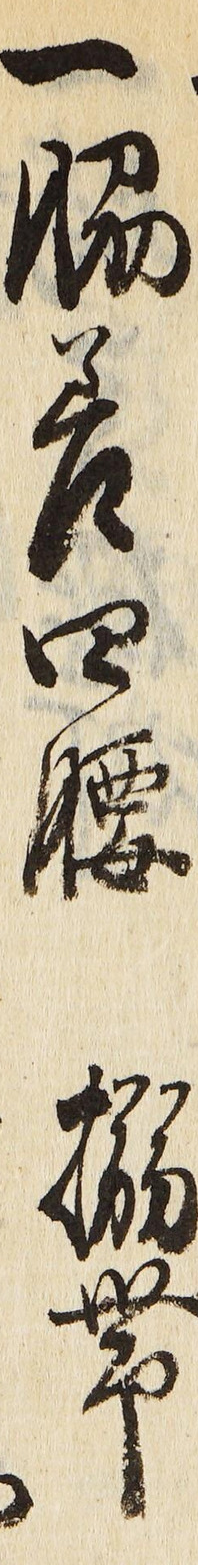一脇差四腰搦帯
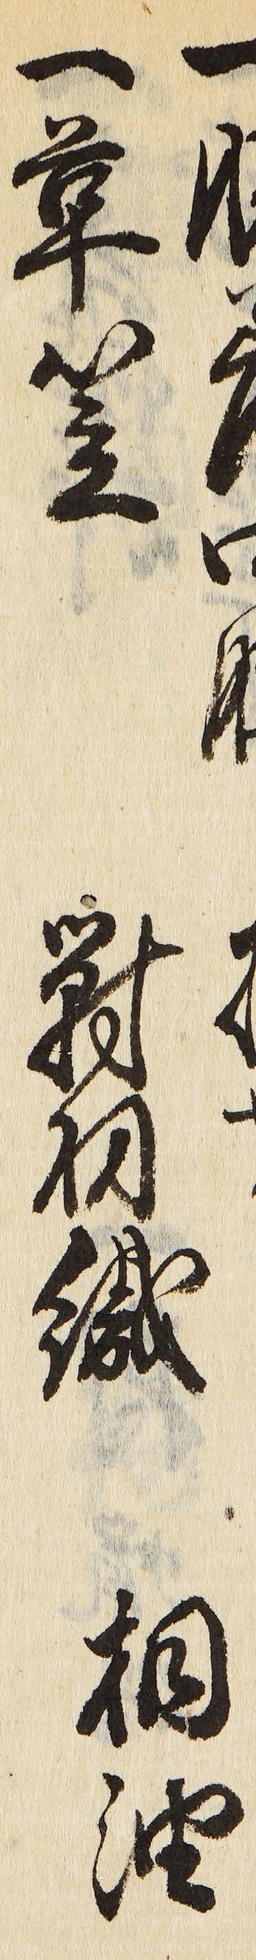一革笠対羽織桐油
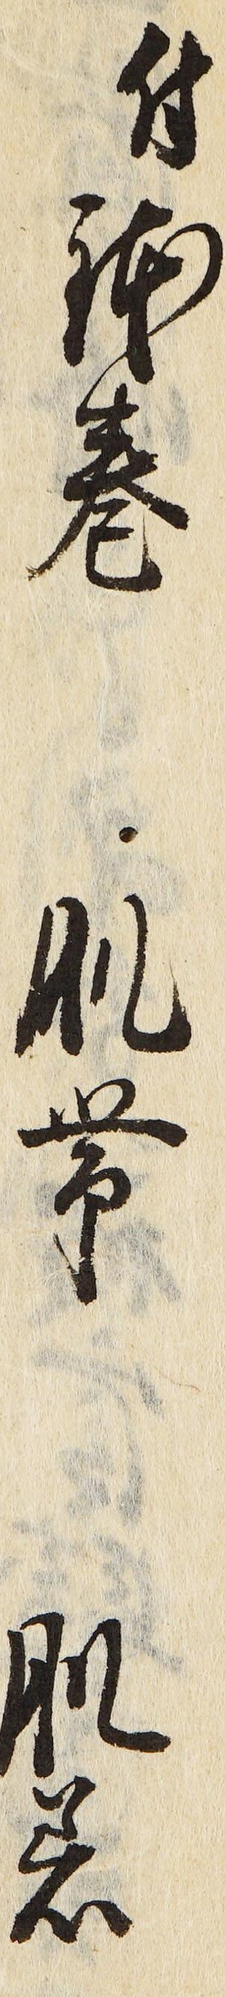付鉢巻肌帯肌着
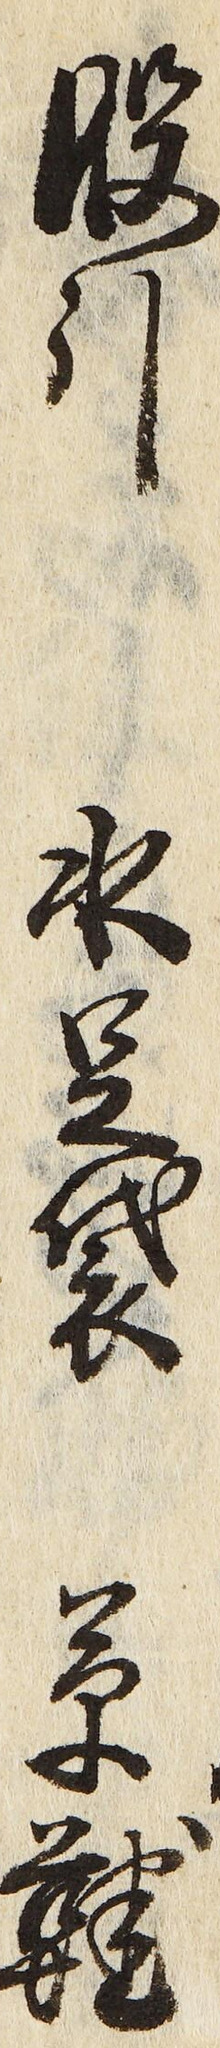股引水足袋草鞋
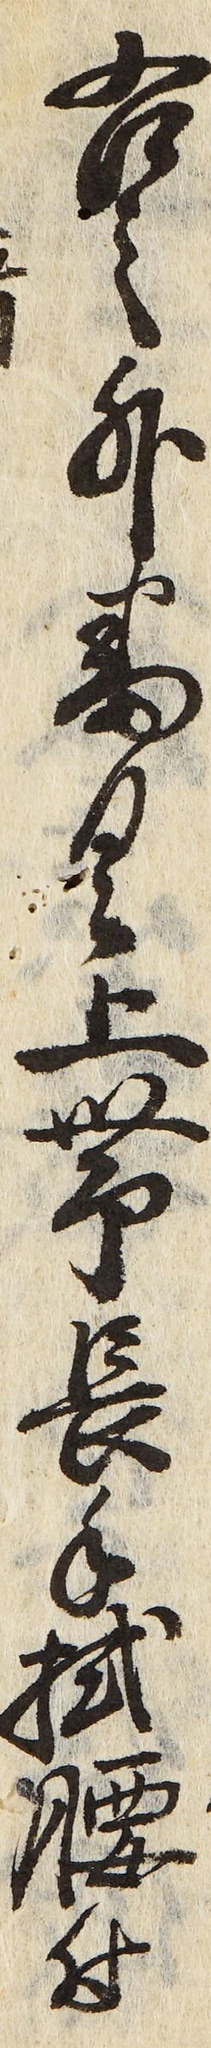右之外番具上帯長手拭腰付
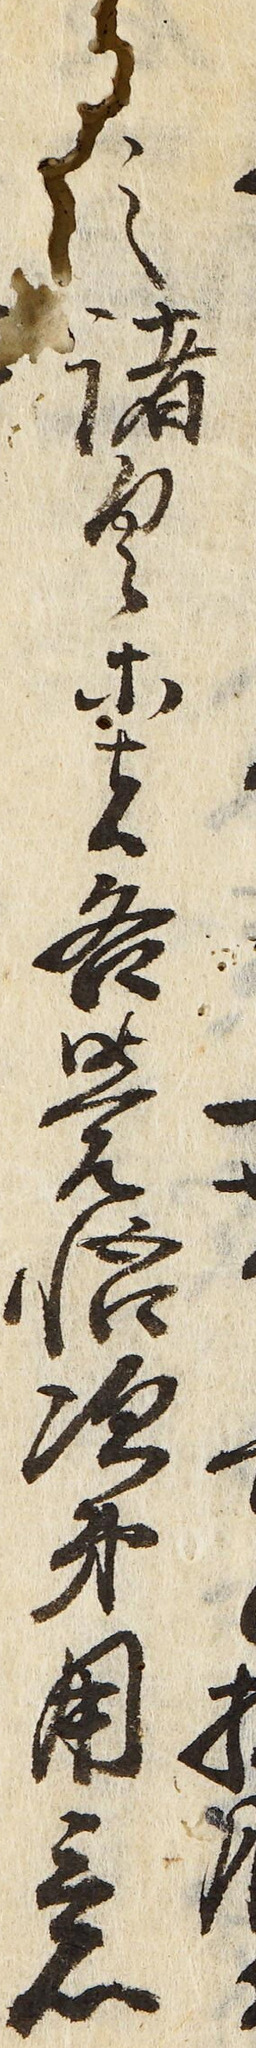之諸具等者各覚悟次第用意
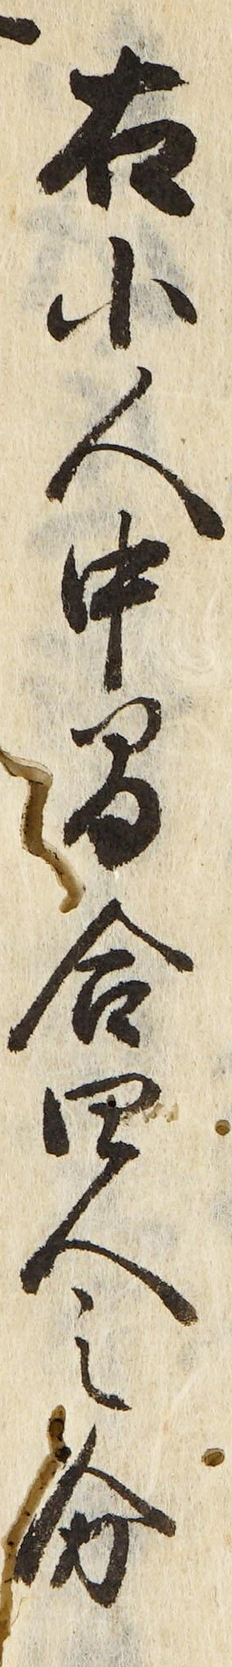右小人中間合四人之分

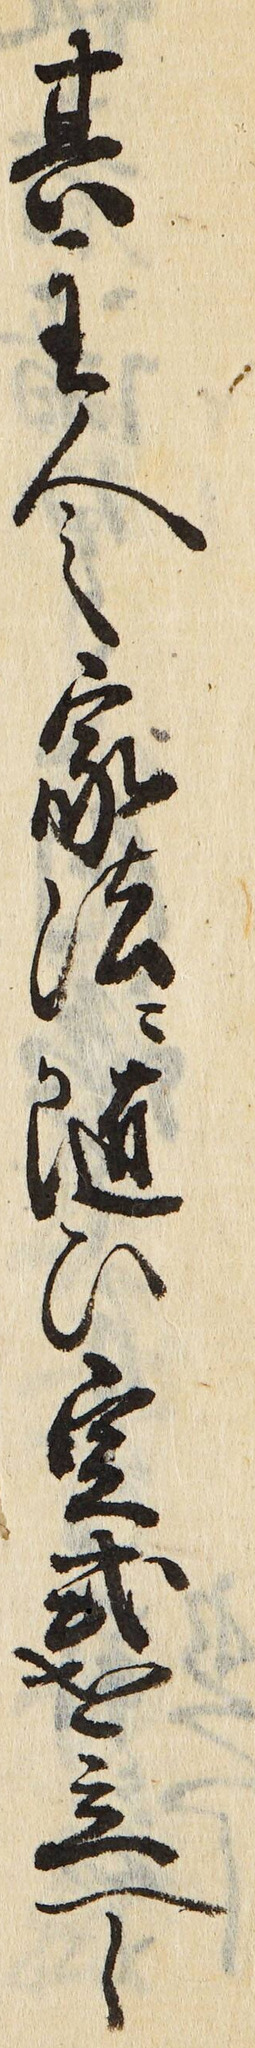其主人之家法ニ随ひ定式を立へし
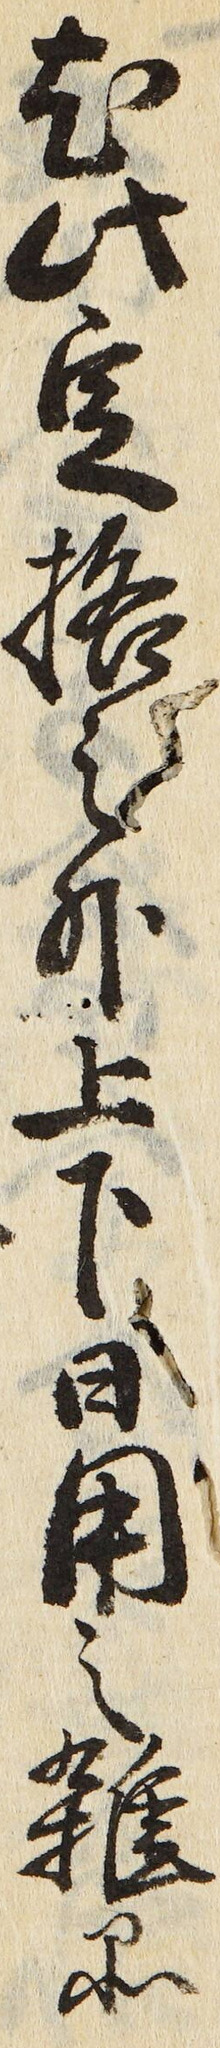尤此定格之外上下日用之雑品
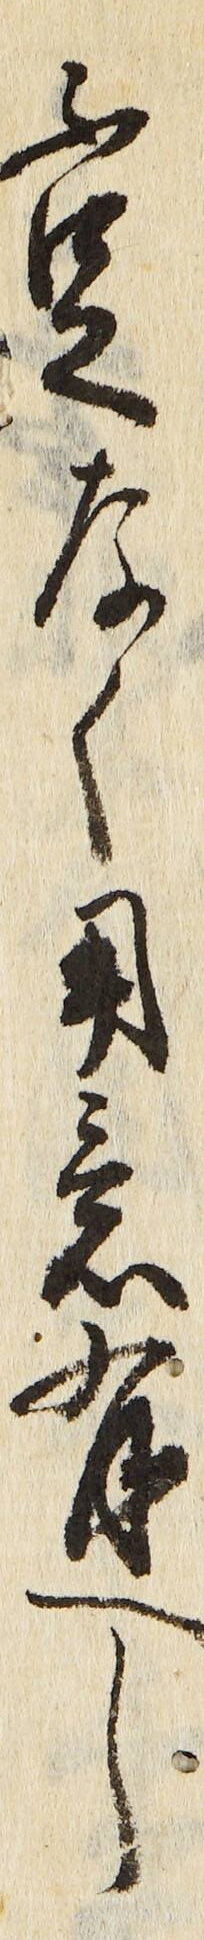不足なく用意有へし
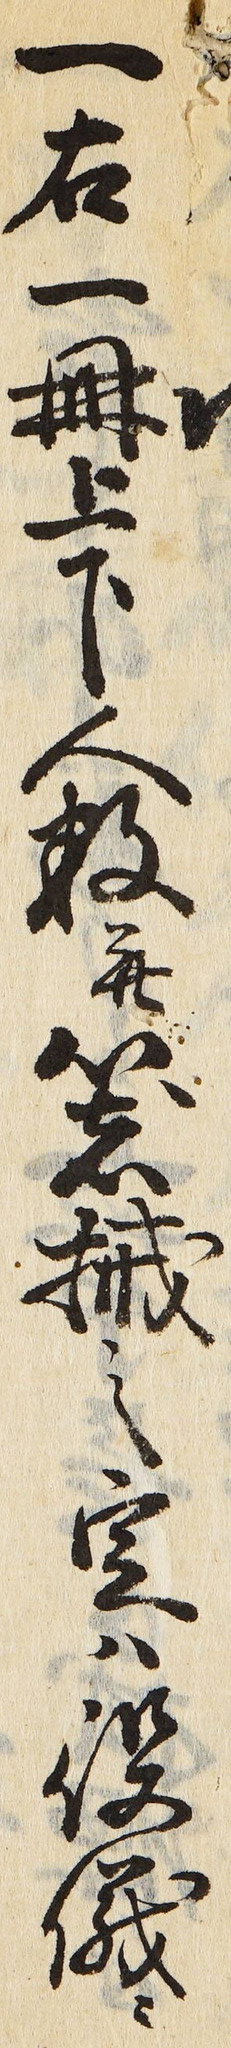一右一冊上下人数并器械之定ハ役儀ニ
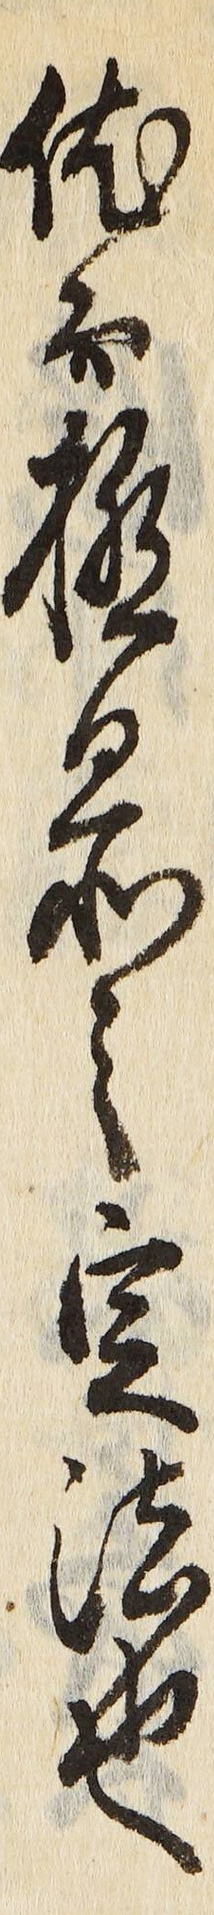依而極る所之定法也
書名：御領海江異国船漂流有之節御手当之次第大組頭心得之廉々書集記
